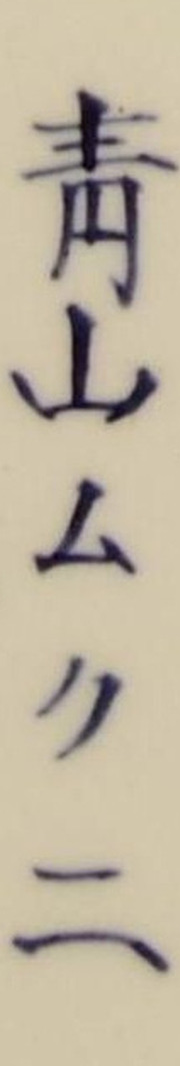青山ムクニ
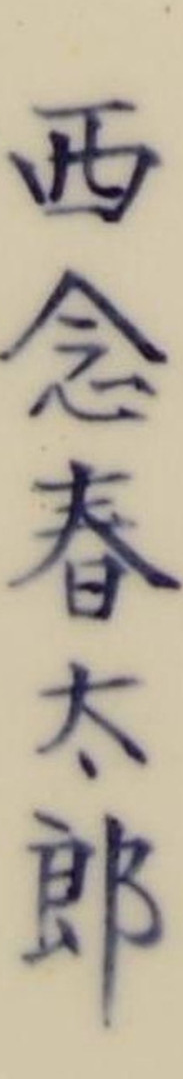西念春太郎
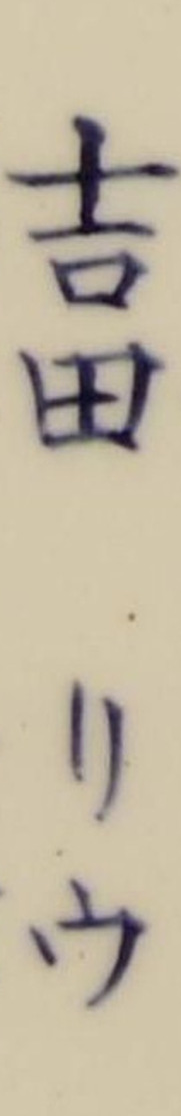吉田リウ
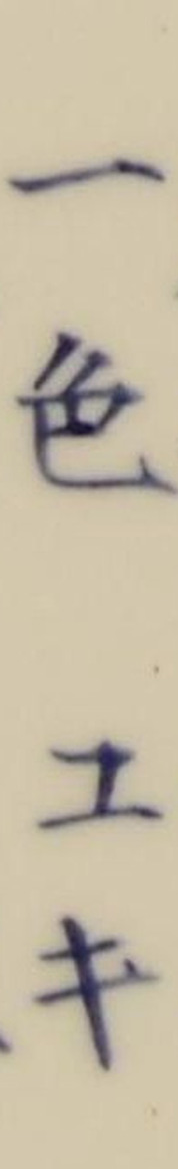一色ユキ
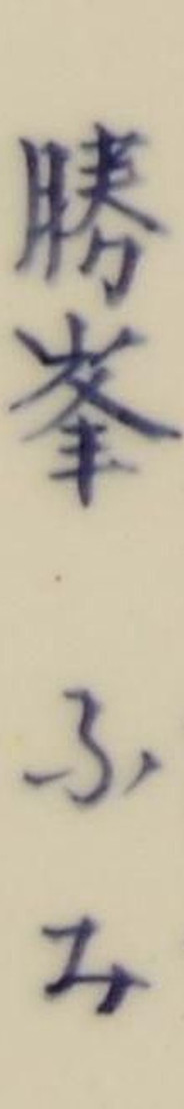勝峯ふみ
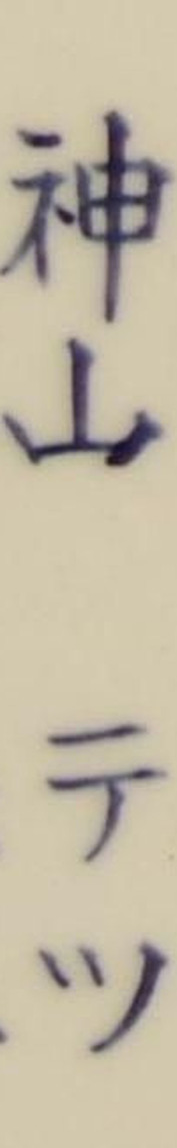神山テツ
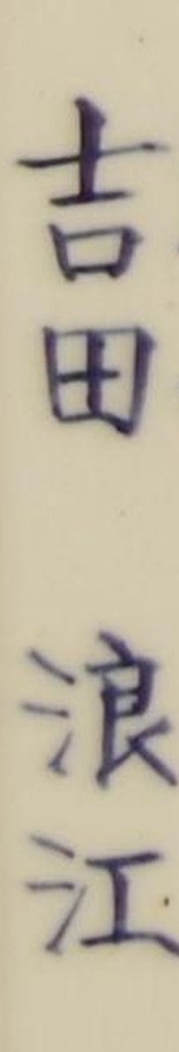吉田浪江

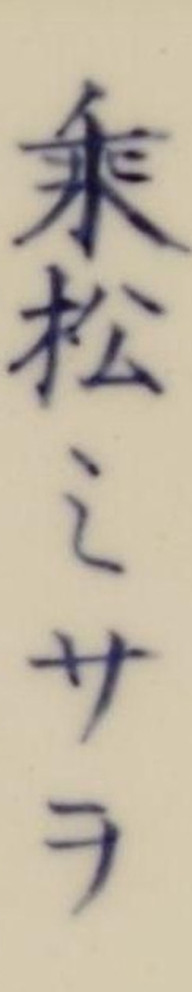乗松ミサヲ
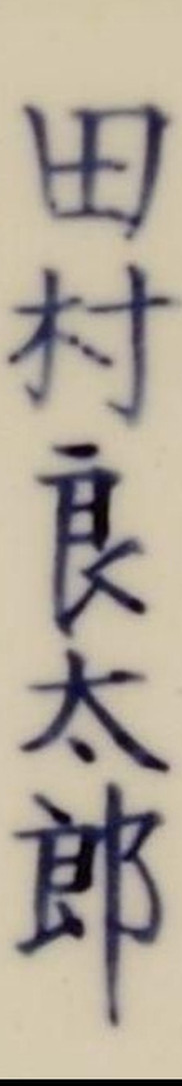田村良太郎
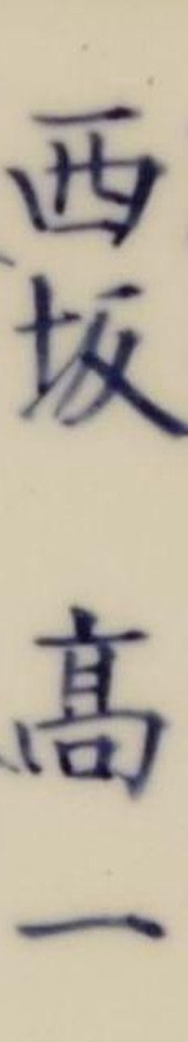西坂高一
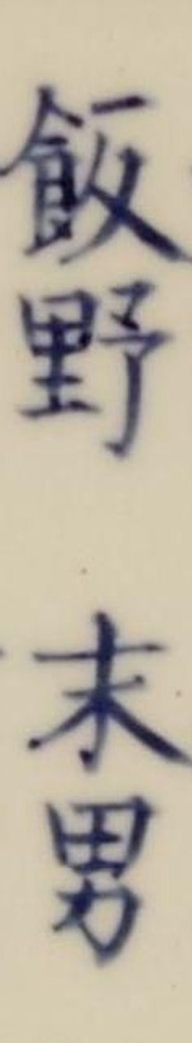飯野末男
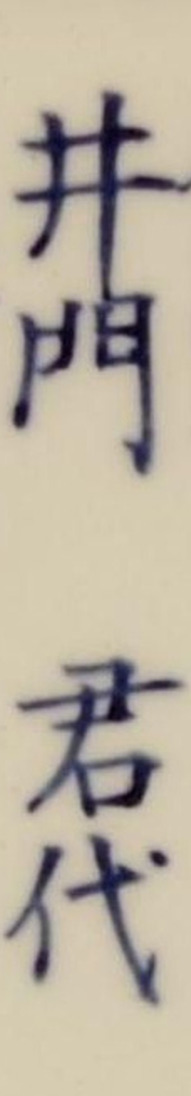井門君代
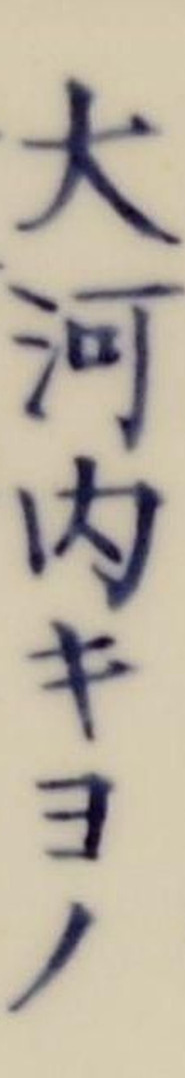大河内キヨノ
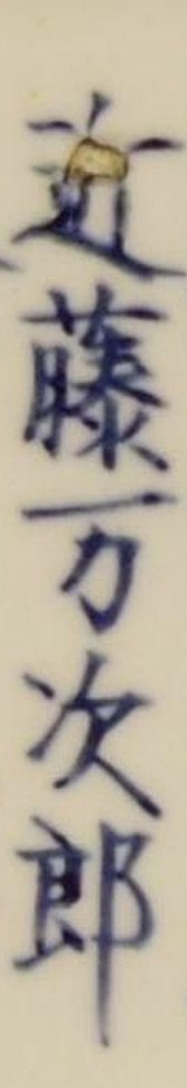近藤万次郎
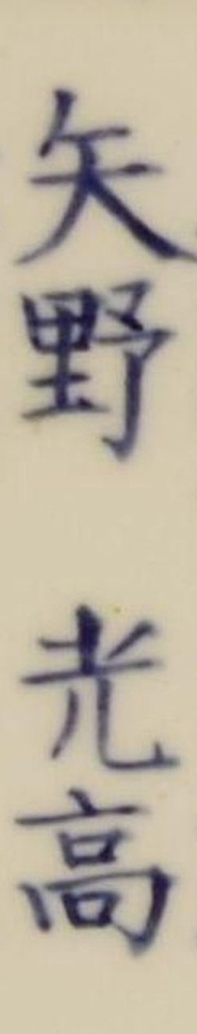矢野光高
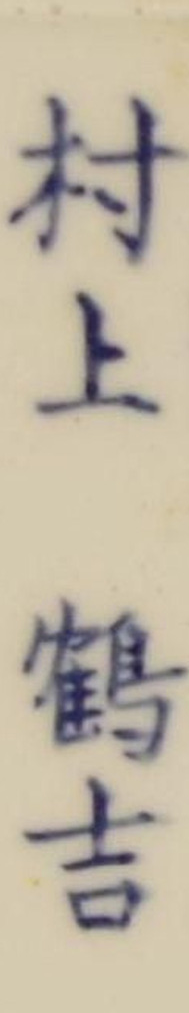村上鶴吉
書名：E~L
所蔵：高野山金剛峯寺
